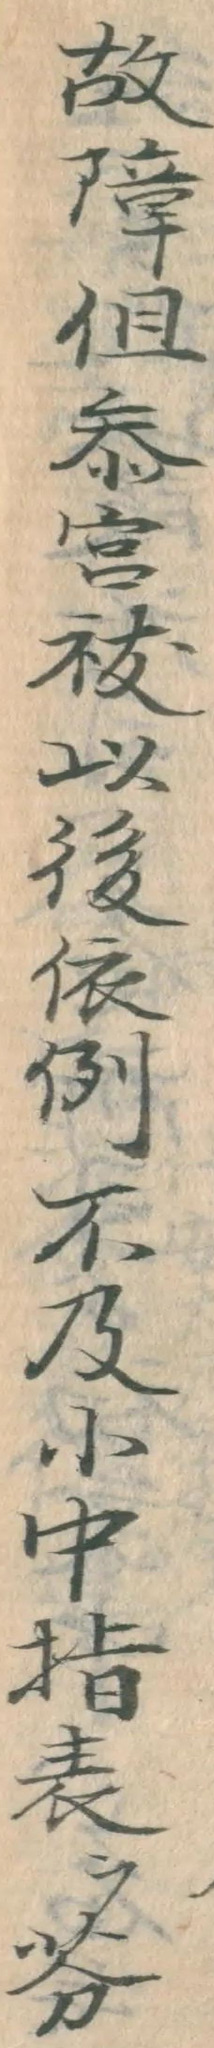故障但参宮祓以後依例不及小中指表ヲ芬

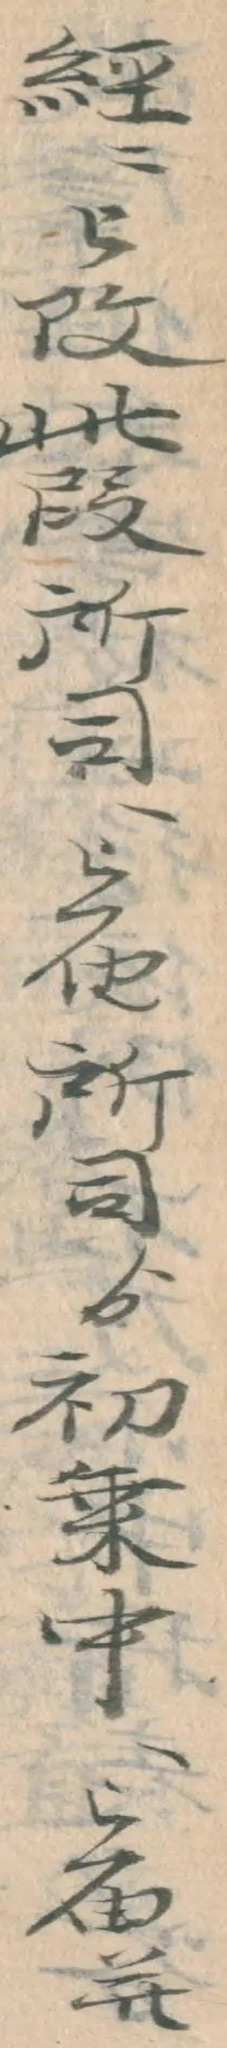経ニ被改此段所司ヘ被届所司ゟ初乗中ヘ被届并
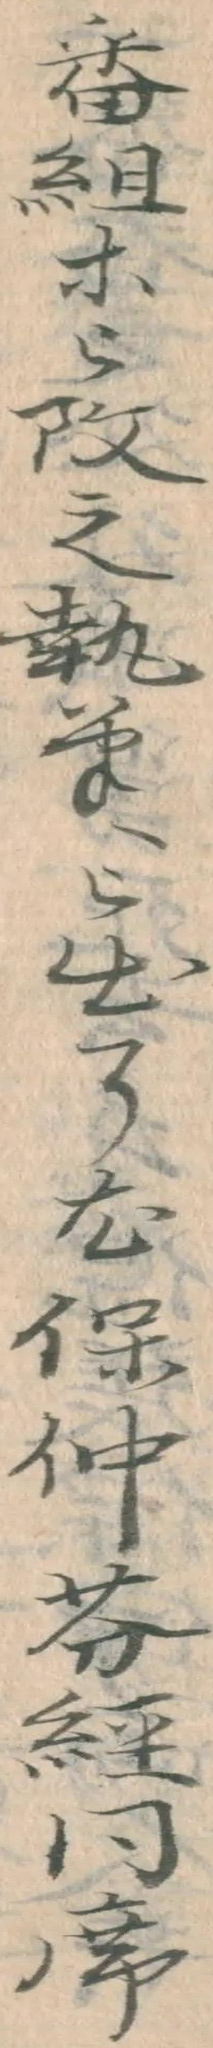番組等被改之執筆へ被出了尤保仲芬経同席
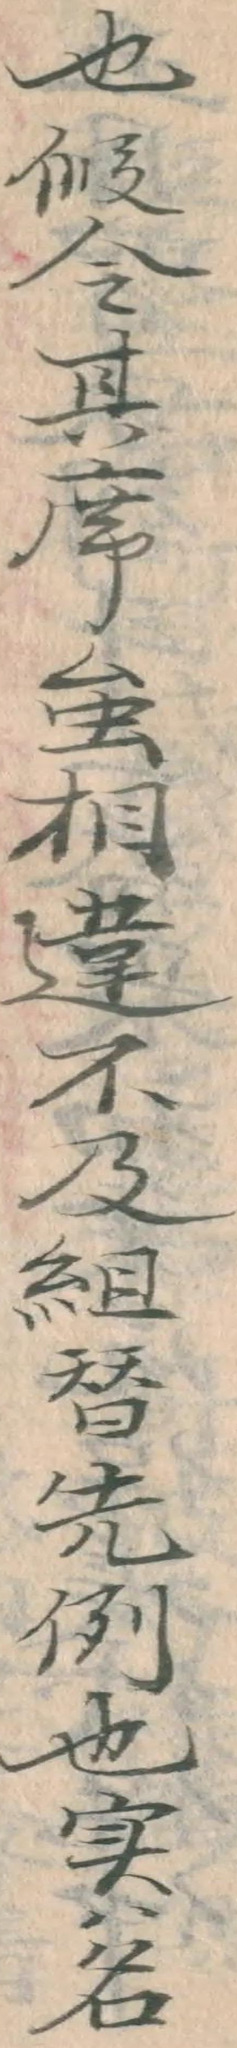也仮令其席雖相違不及組替先例也実ハ名
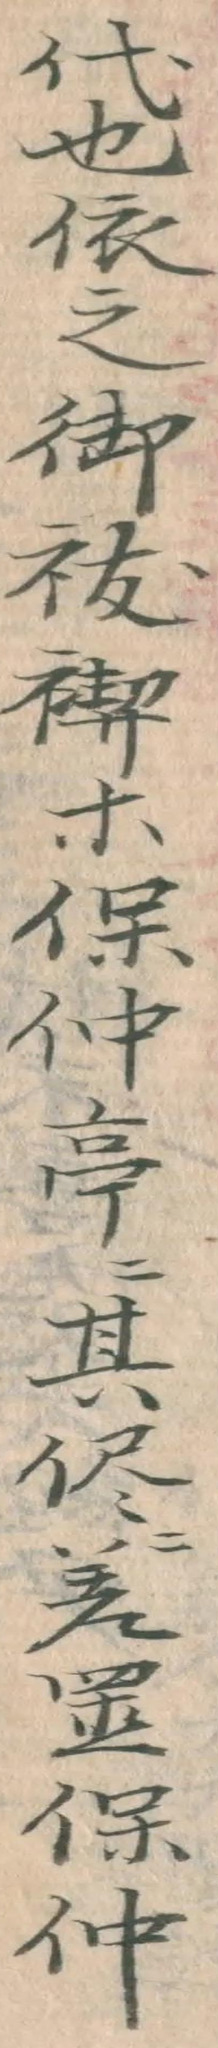代也依之御被禊等保仲亭ニ其侭ニ差置保仲
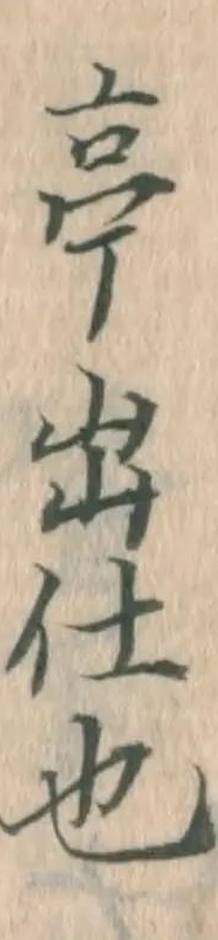亭出仕也
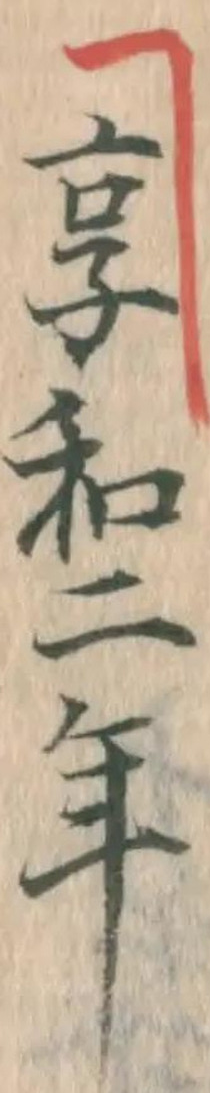享和二年
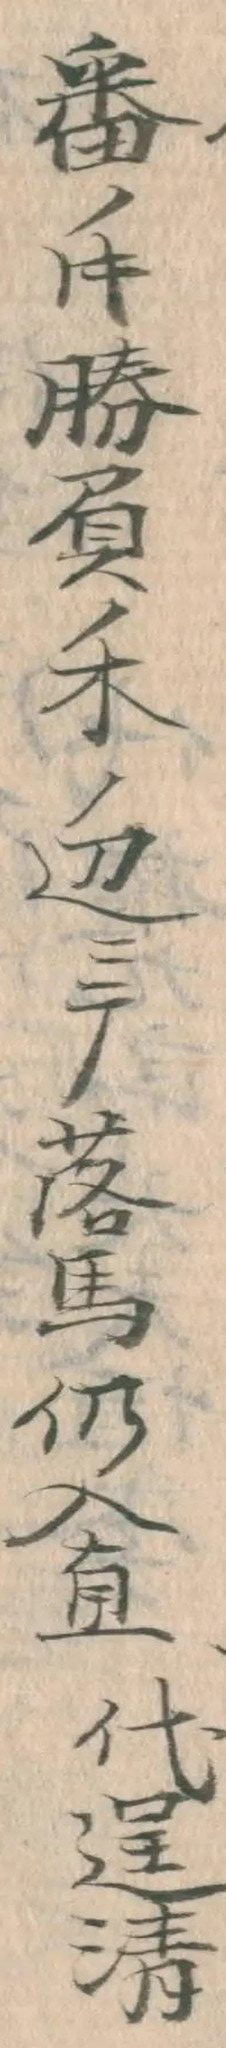番ノトキ勝負ノ木ノ辺ニテ落馬仍入直代逞清
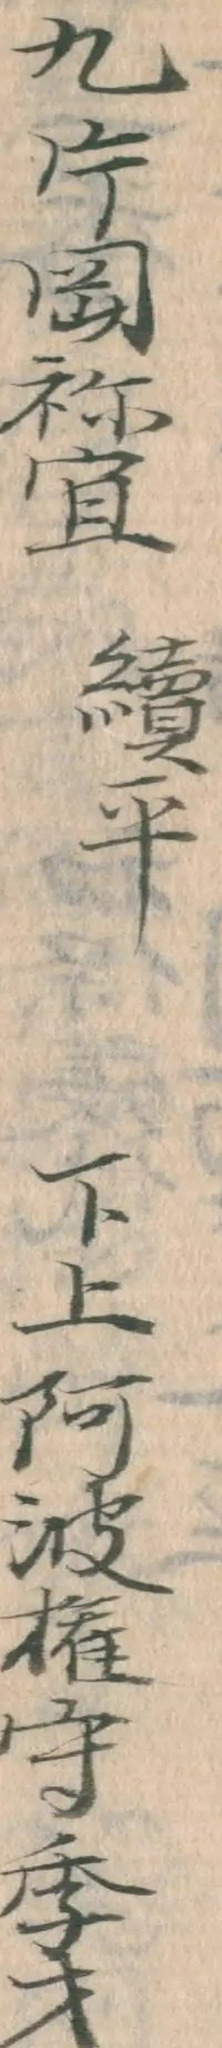九片岡祢宜続平下上阿波権守季才
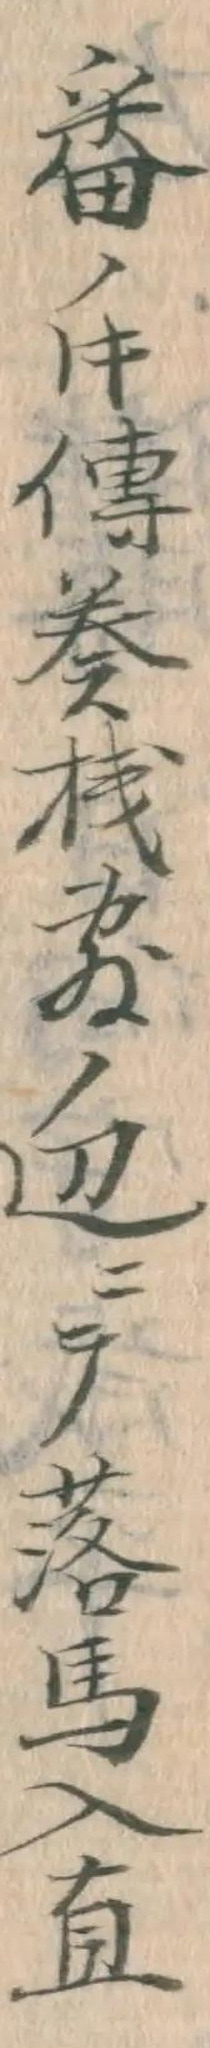番ノトキ伝奏桟敷ノ辺ニテ落馬入直
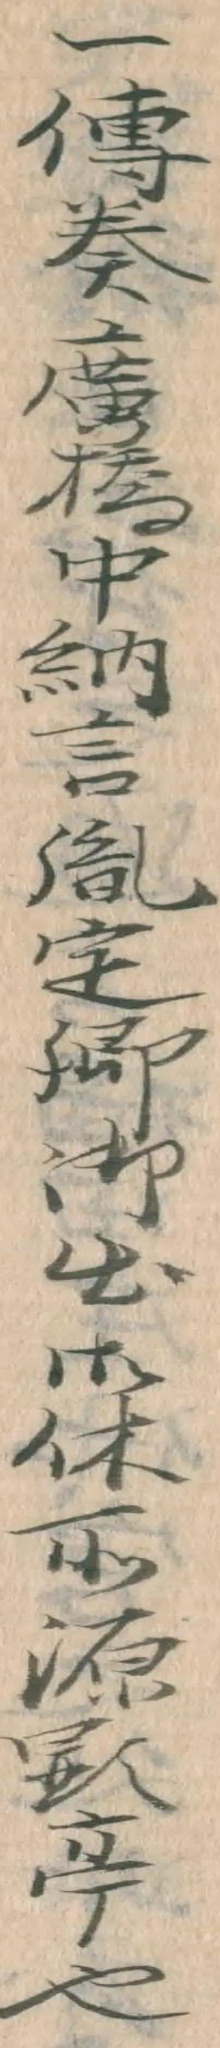一伝奏広橋中納言胤定卿御出御休所源顕亭也
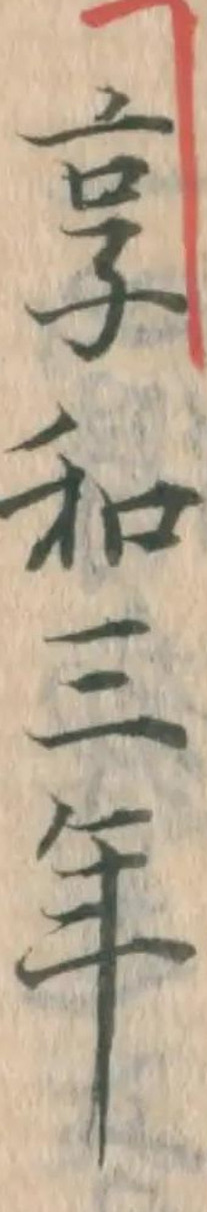享和二年
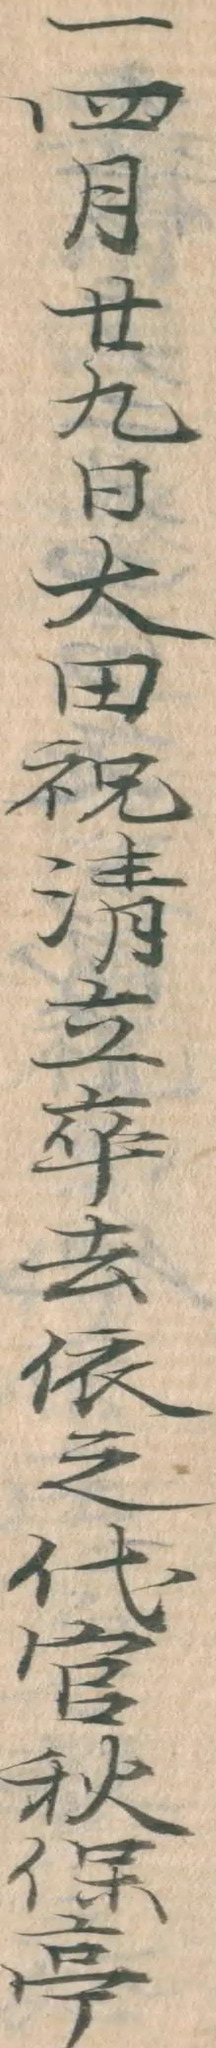一四月廿九日大田祝清立卒去依之代官秋保亭
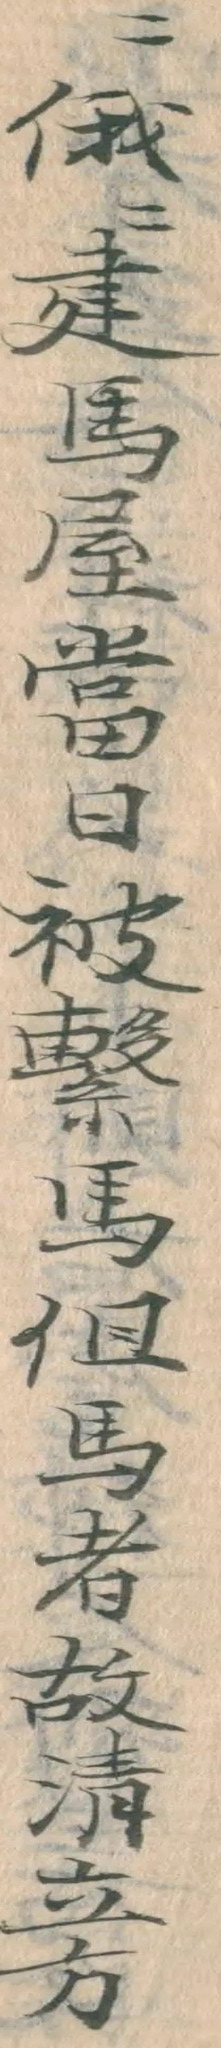ニ俄ニ建馬屋当日被繋馬但馬者故清立方
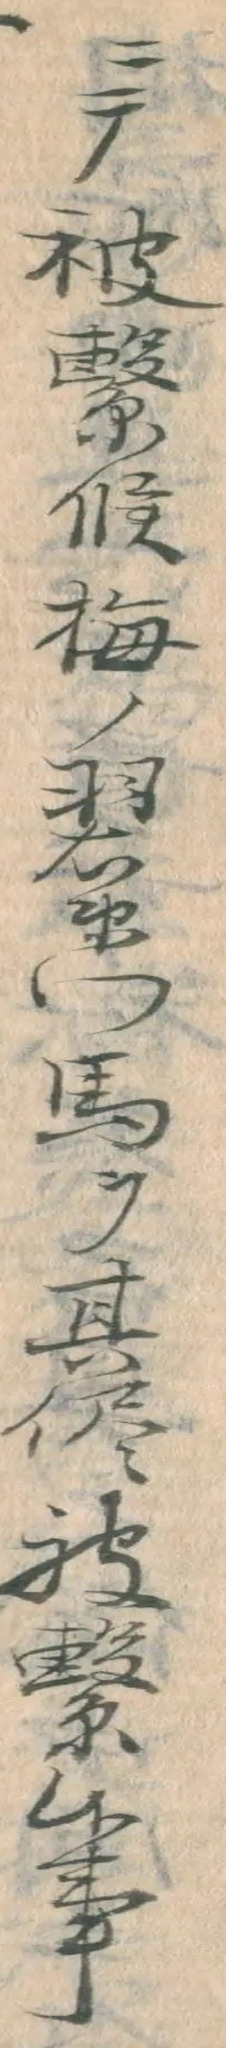ニテ被繋候梅ノ羽右衛門馬ヲ其侭被撃候事

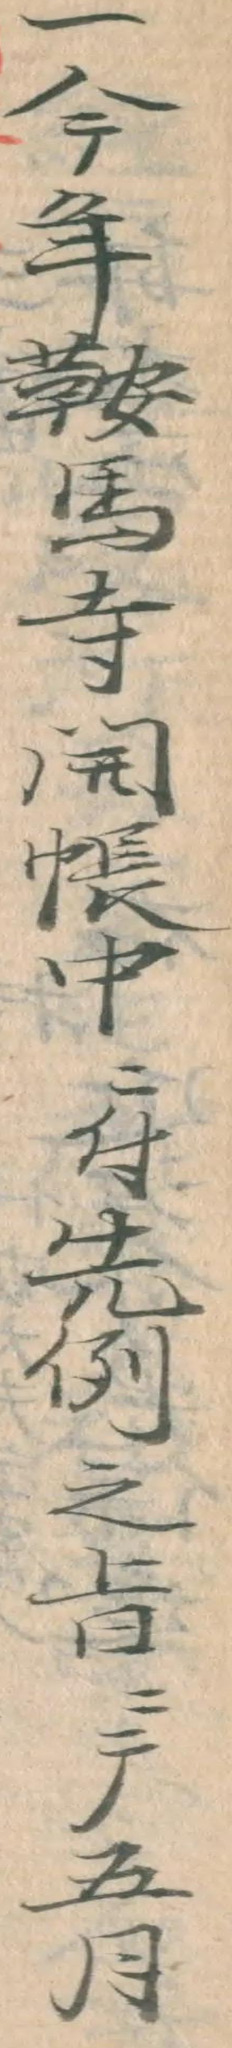一今年鞍馬寺開帳中ニ付先例之旨ニテ五月
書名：賀茂社記録. 第10冊
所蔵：国立国会図書館 National Diet Library, JAPAN
